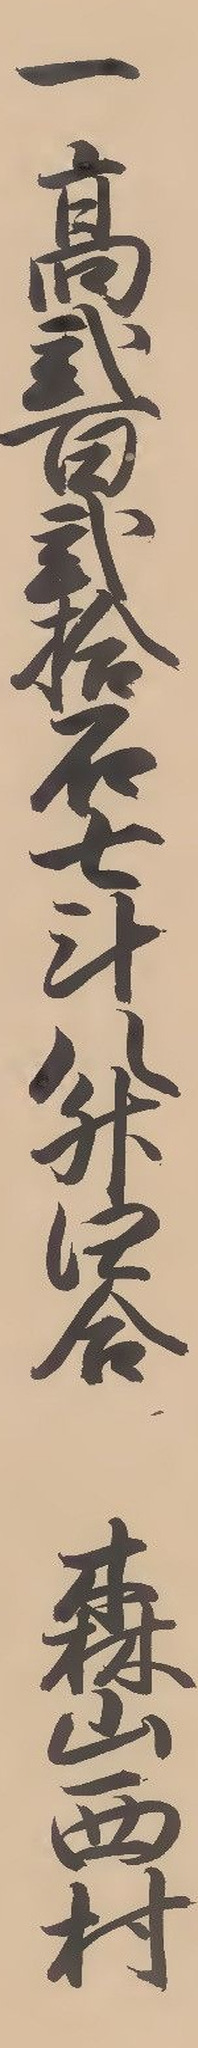一高弐百弐拾石七斗八升四合森山西村
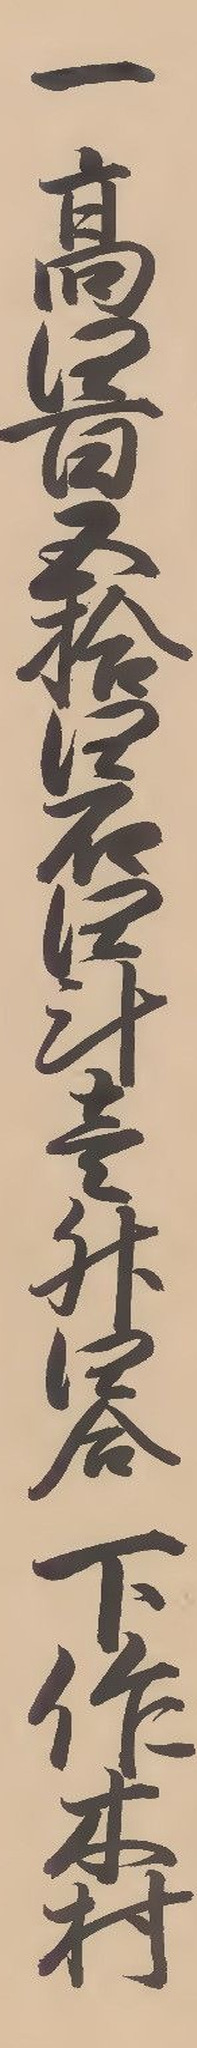一高四百五拾四石四斗壱升四合下作木村
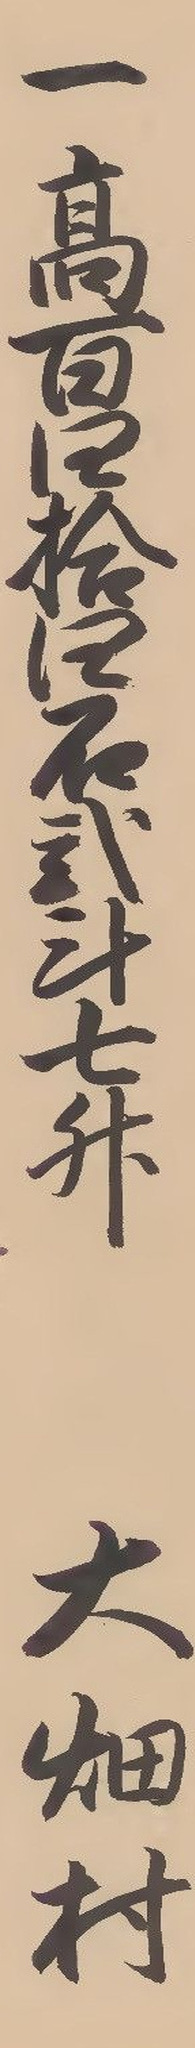一高百四拾四石弐斗七升大畑村

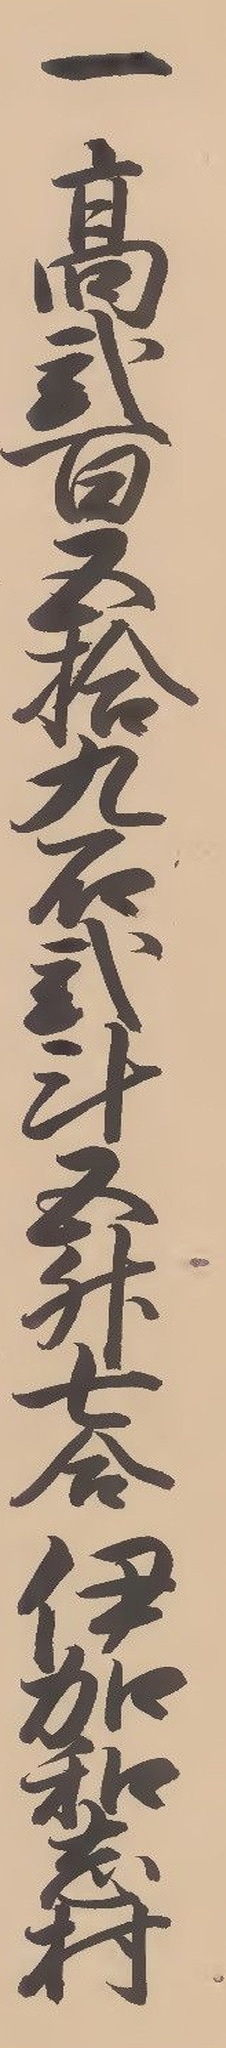一高弐百五拾九石弐斗五升七合伊加和志村
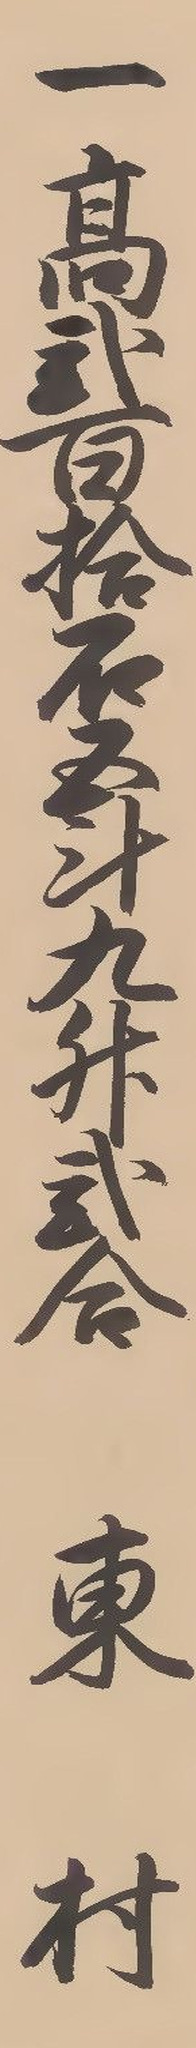一高弐百拾石五斗九升弐合東村
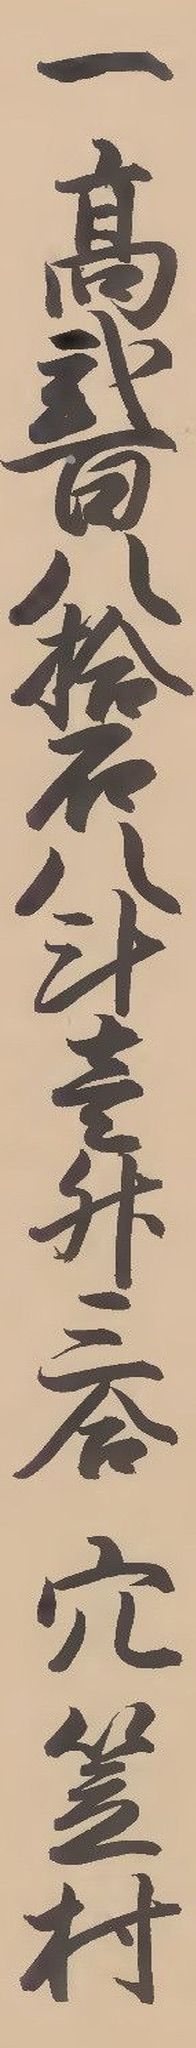一高弐百八拾石八斗壱升三合穴笠村
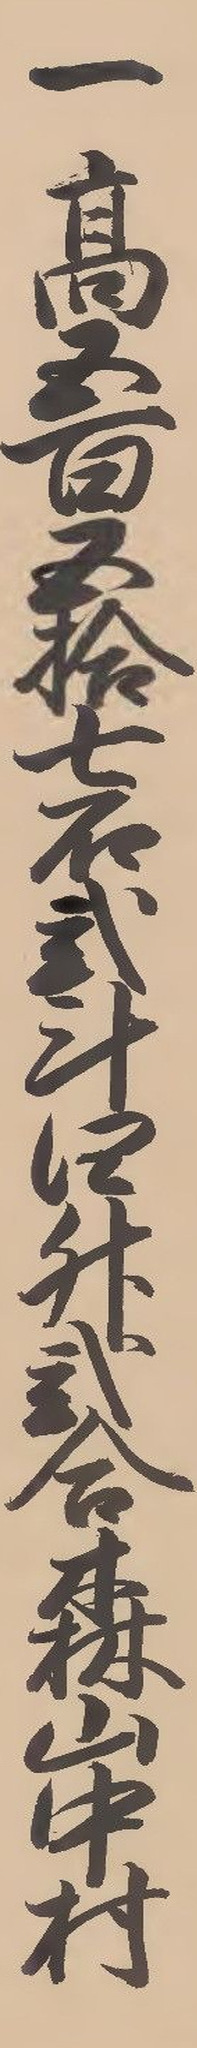一高五百五拾七石弐斗四升弐合森山中村
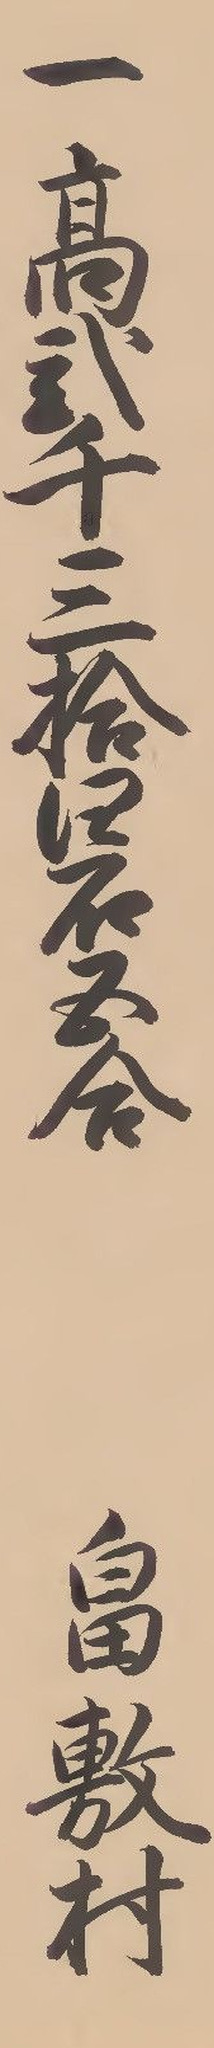一高弐千三拾四石五合畠敷村
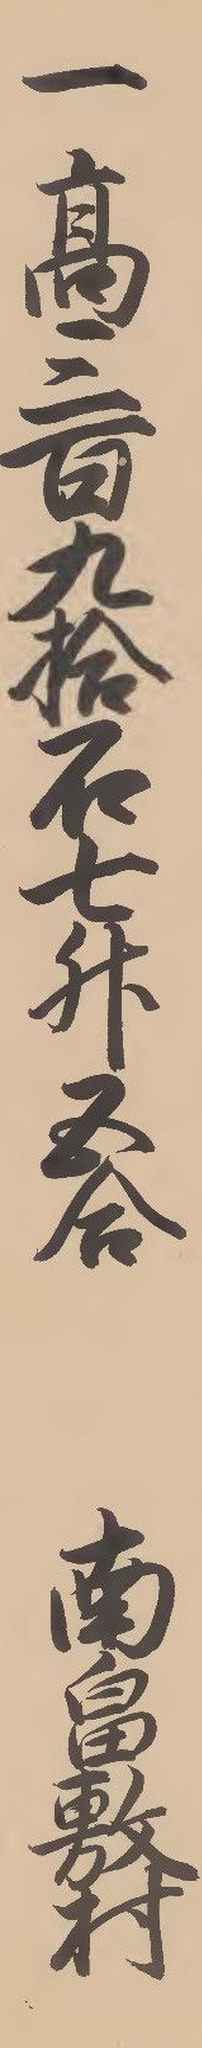一高三百九拾石七升五合南畠敷村
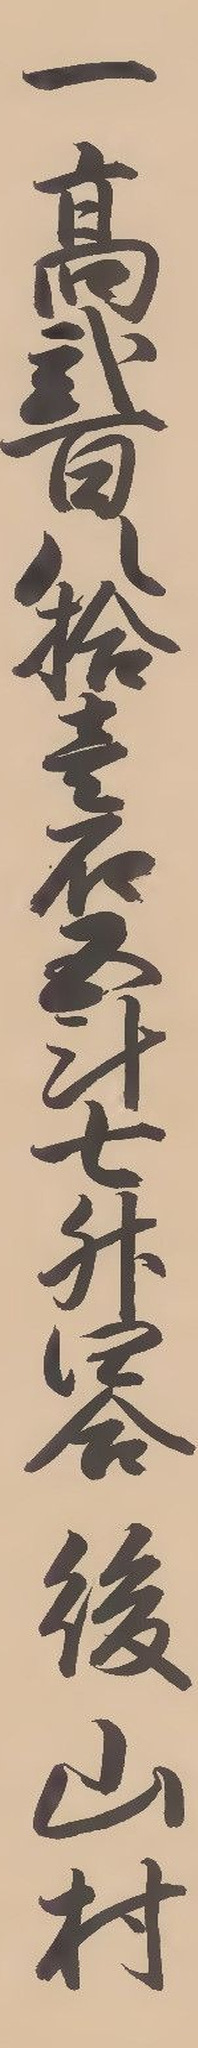一高弐百八拾壱石五斗七升四合後山村
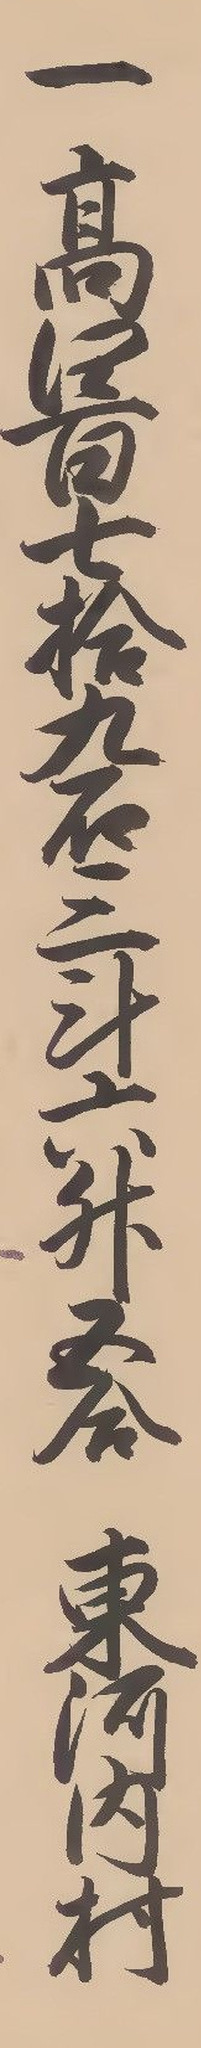一高四百七拾九石三斗六升五合東河内村

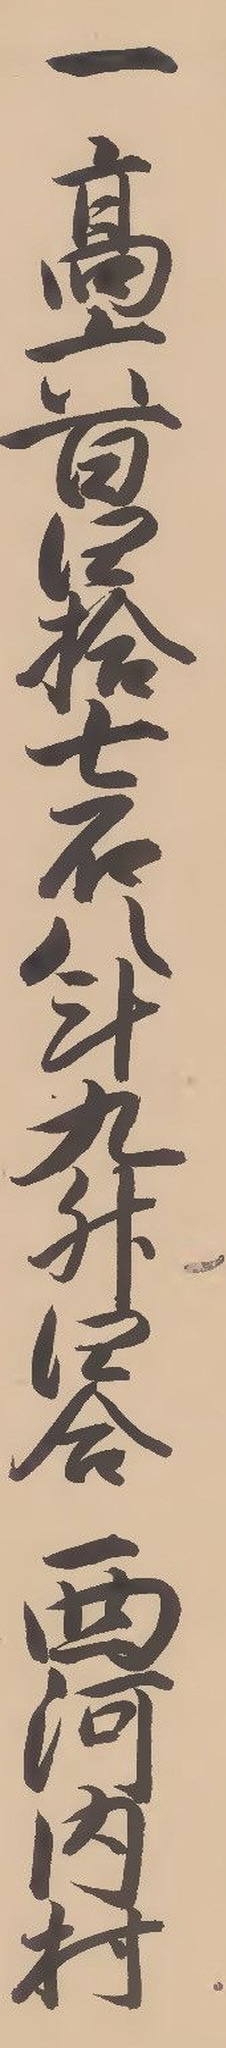一高六百四拾七石八斗九升四合西河内村
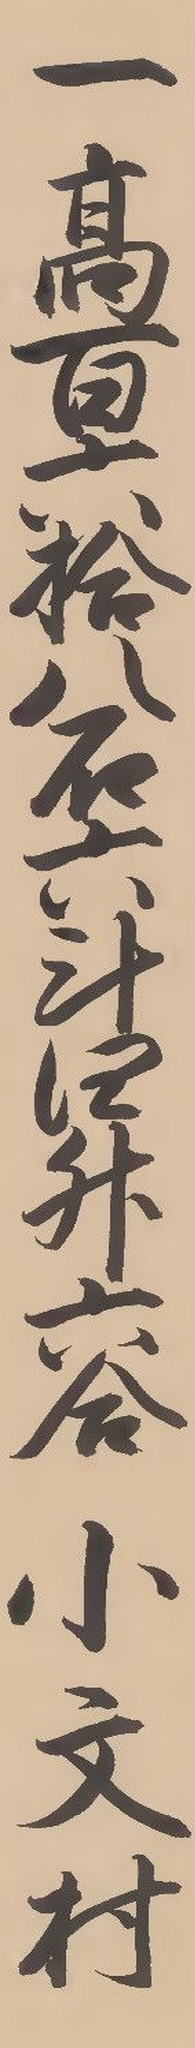一高百六拾八石六斗四升六合小文村
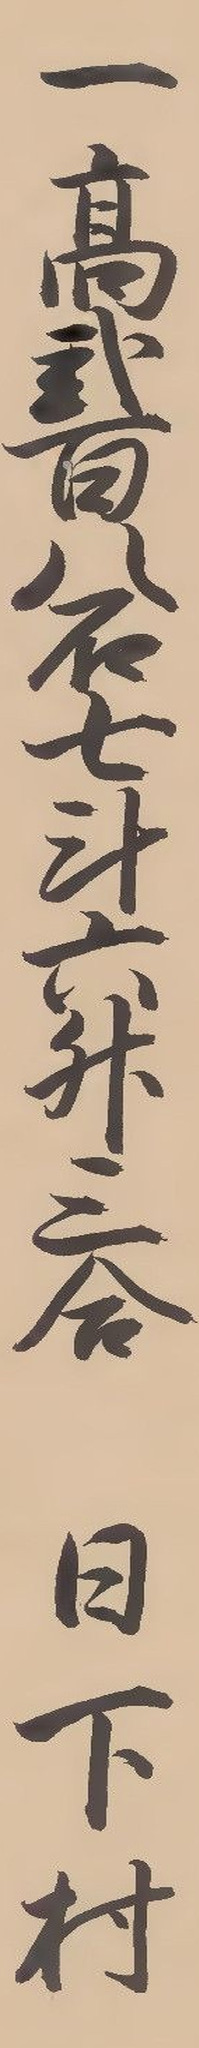一高弐百八石七斗六升三合日下村
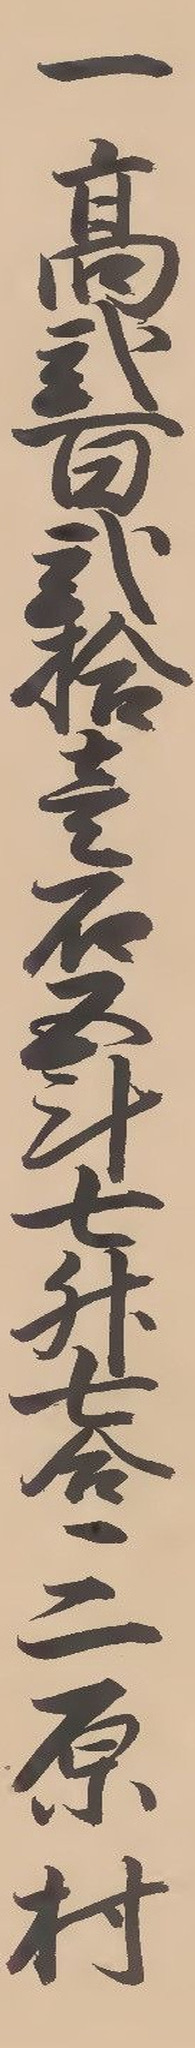一高弐百弐拾壱石五斗七升七合三原村
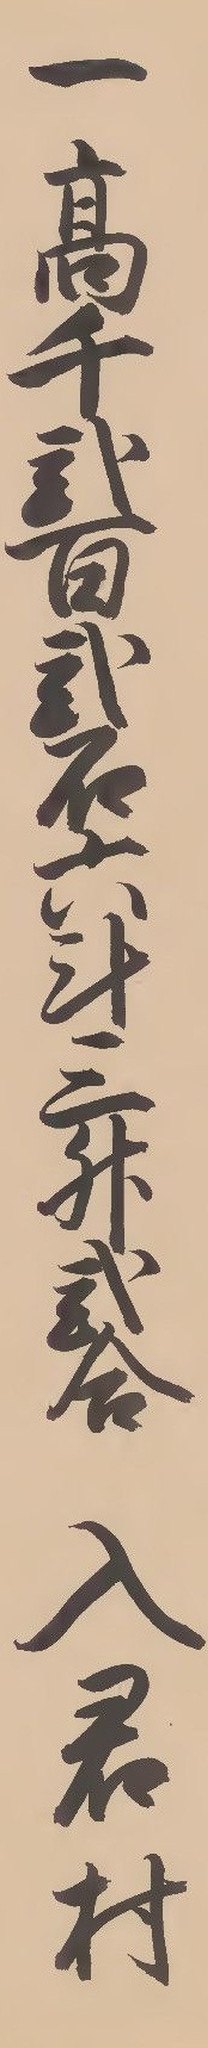一高千弐百弐石六斗三升弐合入君村
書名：備後国郷帳
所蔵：国立公文書館 National Archives of Japan
